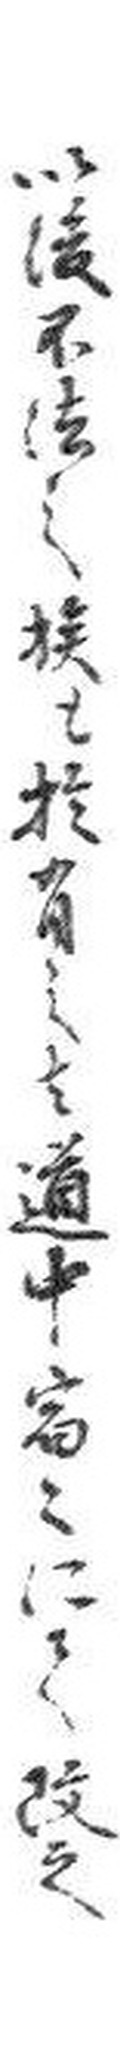以後不法之族も於有之者道中宿々にて改之
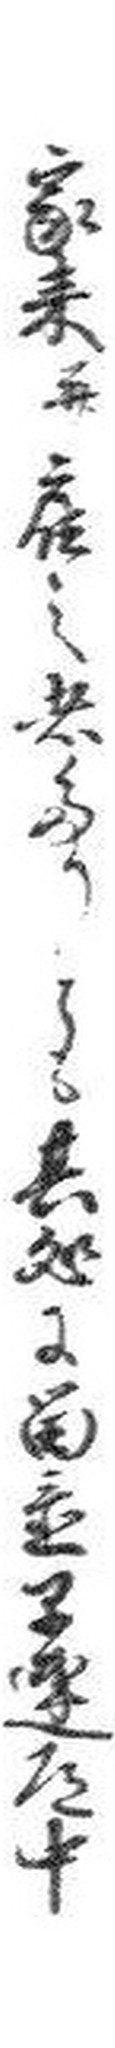家来并雇之者たりとも其処に留置早速道中
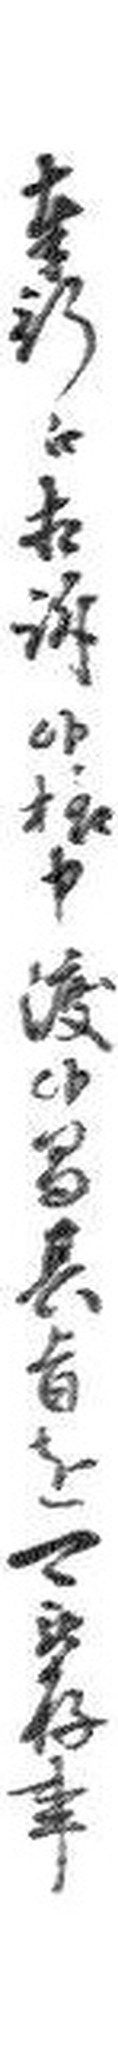奉行江相訴候様申渡候間其旨を可被存事
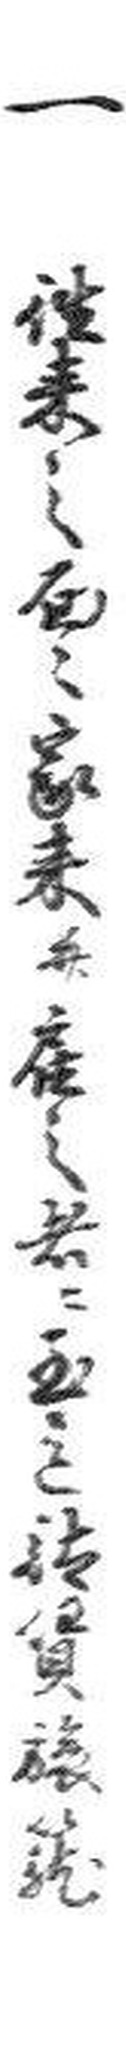一往来之面々家来并雇之者ニ至迄駄賃旅籠
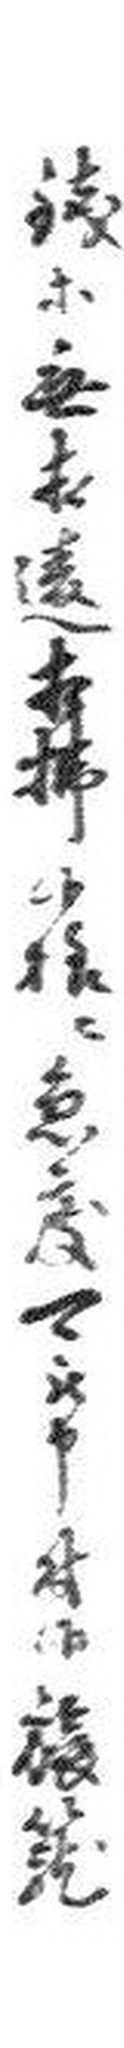銭等無相違相払候様ニ急度可被申付候旅籠
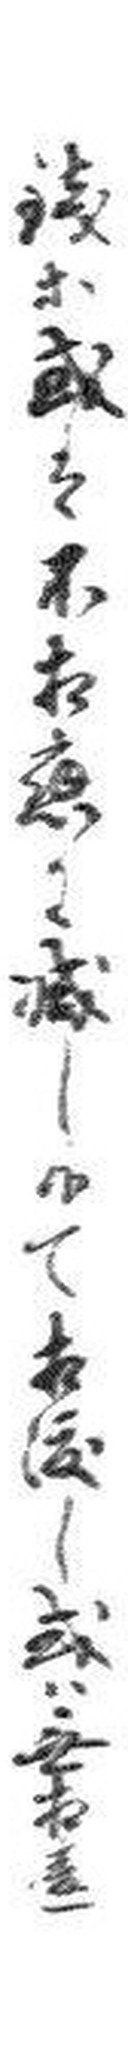銭等或は不相応に減し候て相渡し或ㇵ無相違
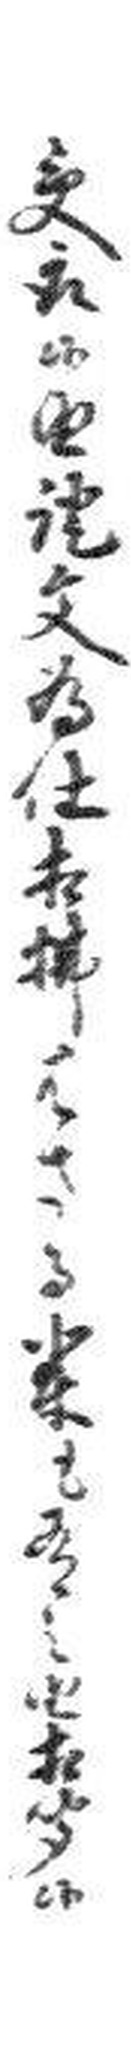受取候由証文為仕相払はさる輩も有之由相聞候
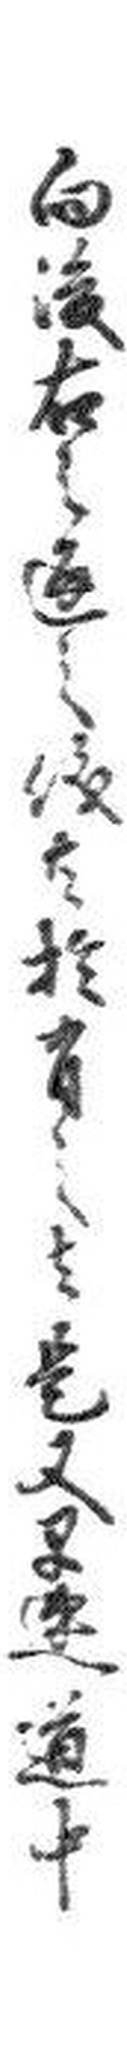向後右之通之儀共於有之者是又早速道中
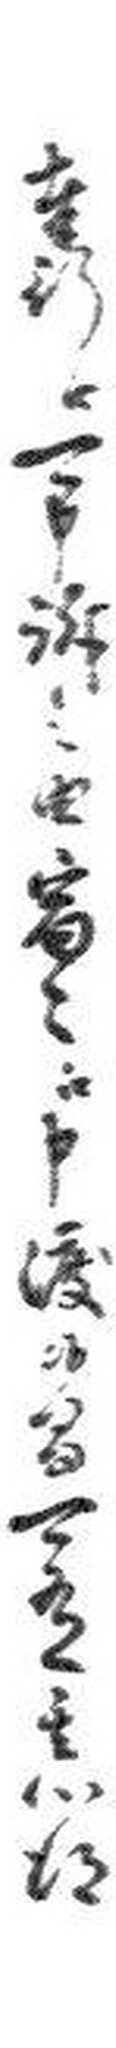奉行江可申訴之由宿々江申渡候間可有其心得
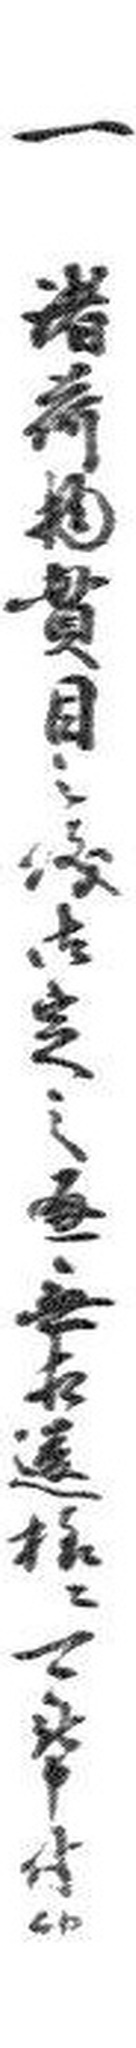一諸荷物貫目之儀御定之通無相違様ニ可被申付候

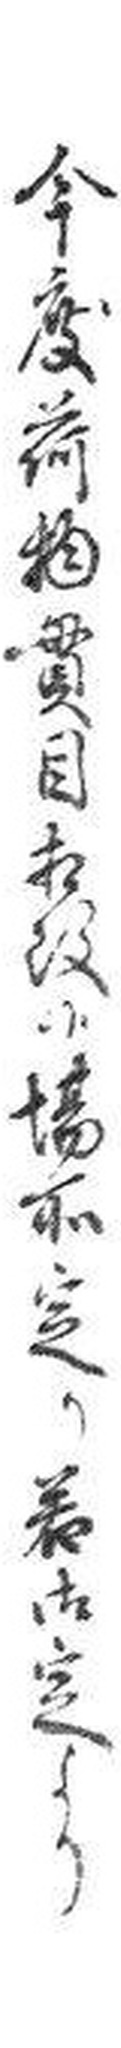今度荷物貫目相改候場所定り若御定より
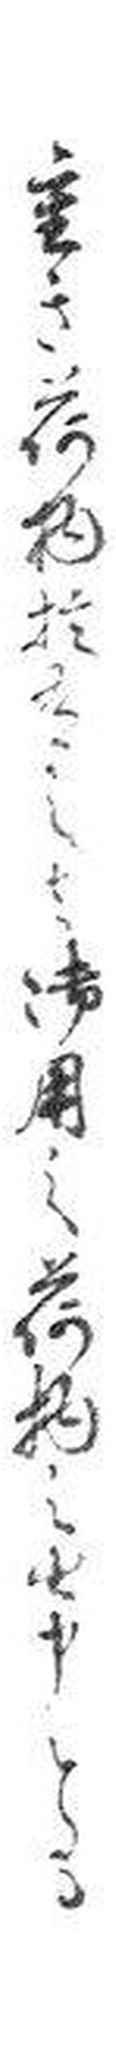重き荷物於有之者御用之荷物之由申とも
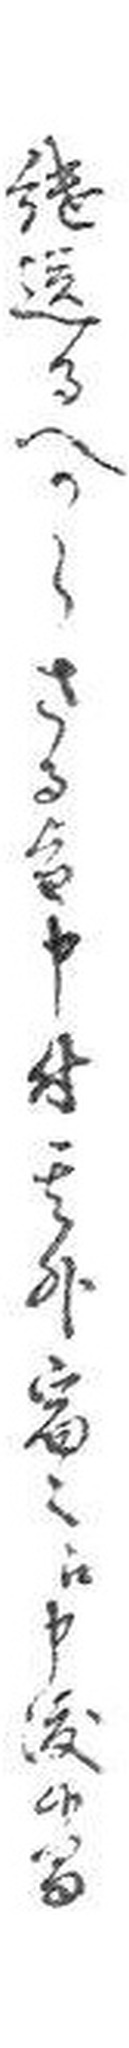継送るへからさる旨申付其外宿々江申渡候間
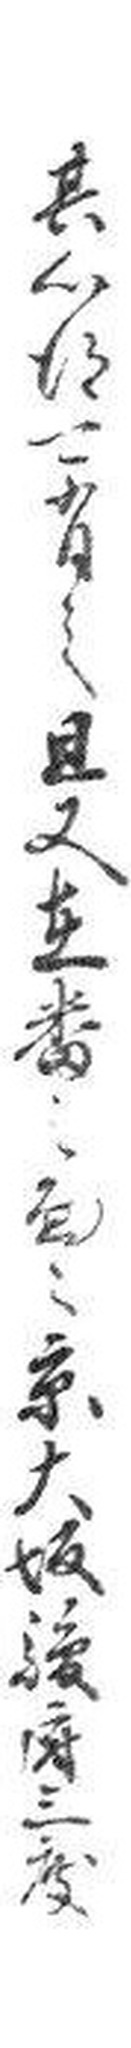其心得可有之且又在番之面々京大坂駿府三度
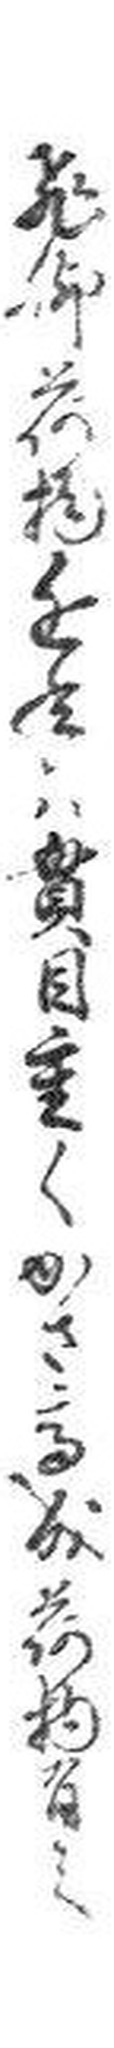飛脚荷物近年ㇵ貫目重くかさ高成荷物有之
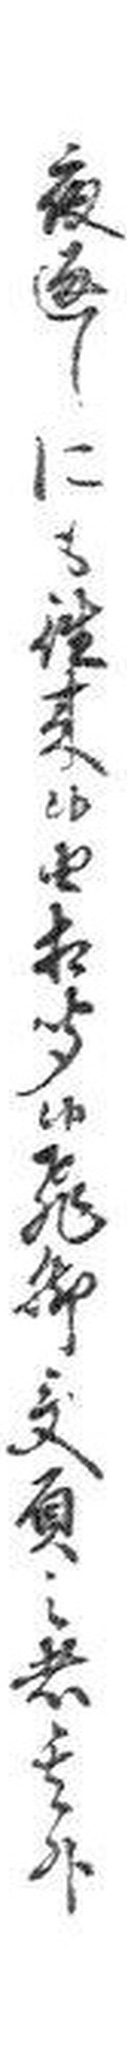夜通しにも往来候由相聞候飛脚受負之者其外
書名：家譜 二十九 吉邦公 従正徳二年到正徳三年
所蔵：福井県文書館 Fukui Prefectural Archives
